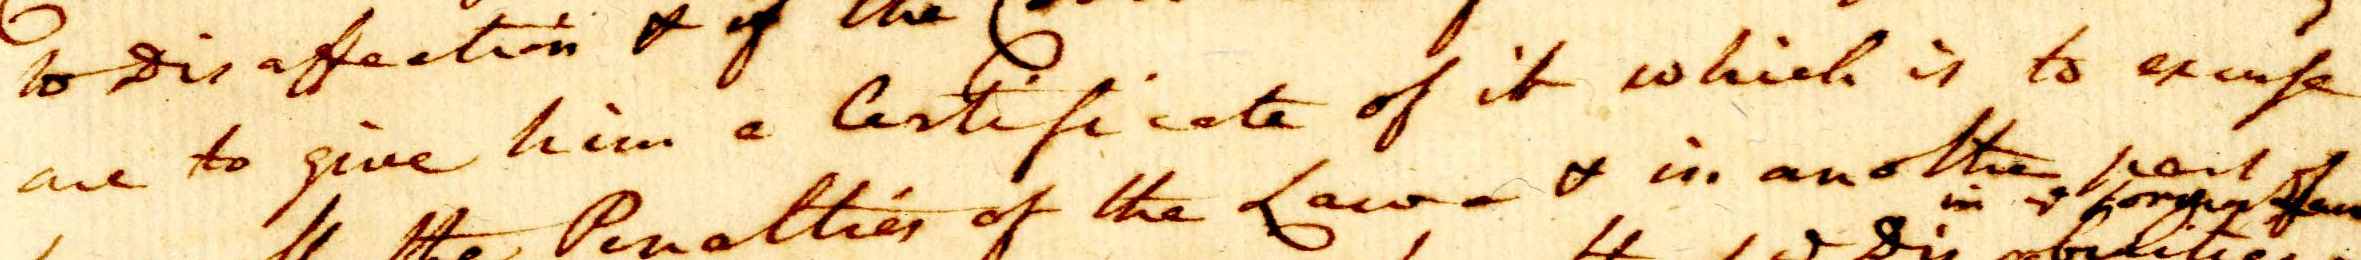are to give him a Certificate of it which is to excuse
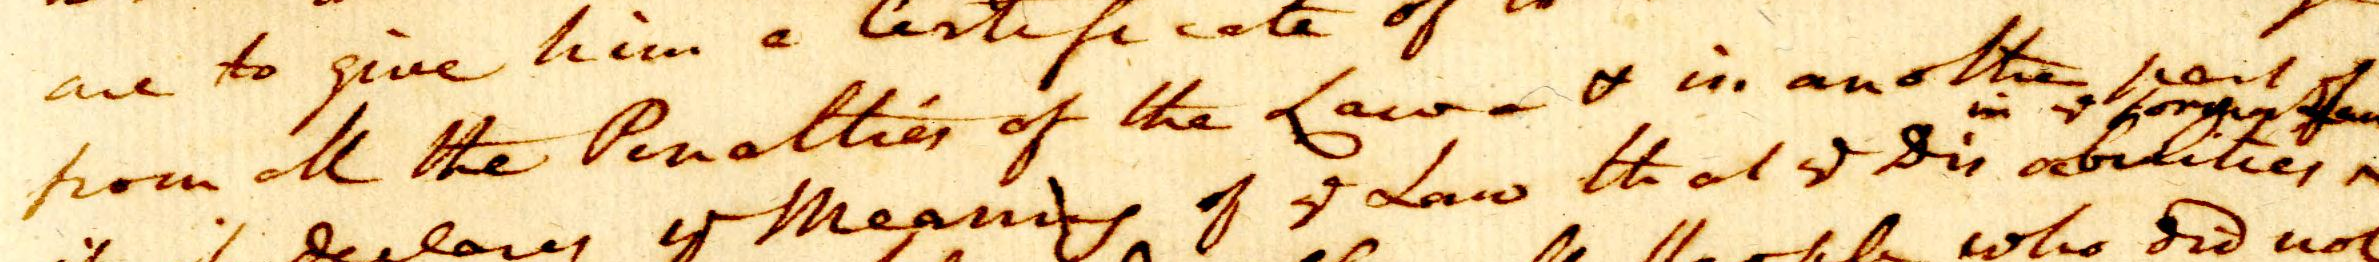from all the Penalties of the Law & in another part of
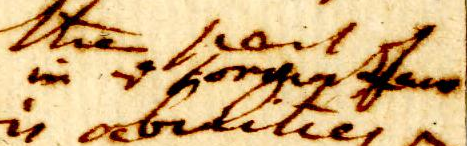in y^e former Laws
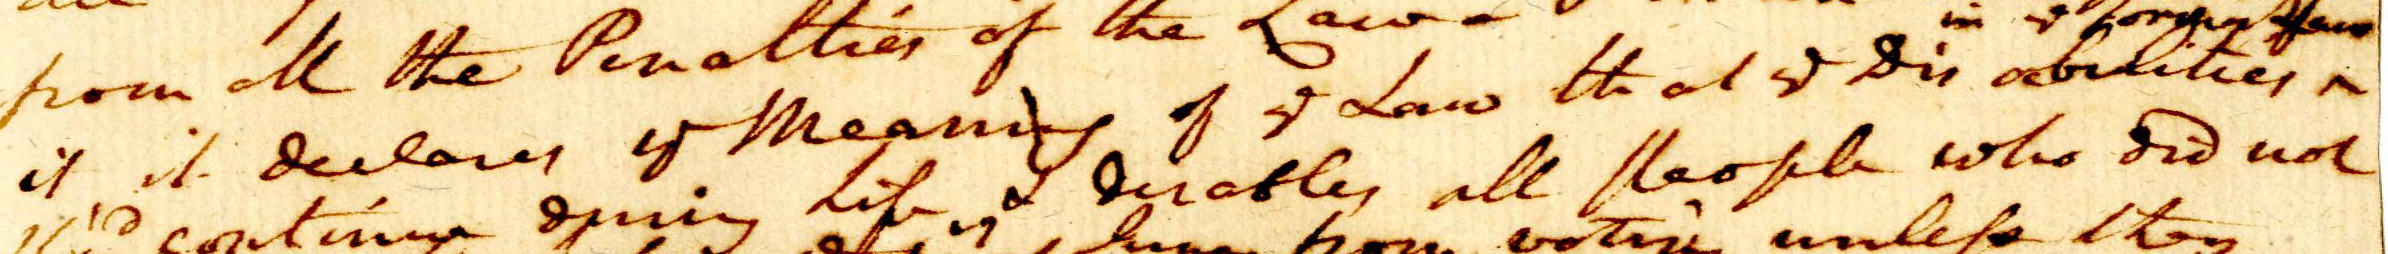it, it declares y^e Meaning of y^e Law that y^e Disabilities ^
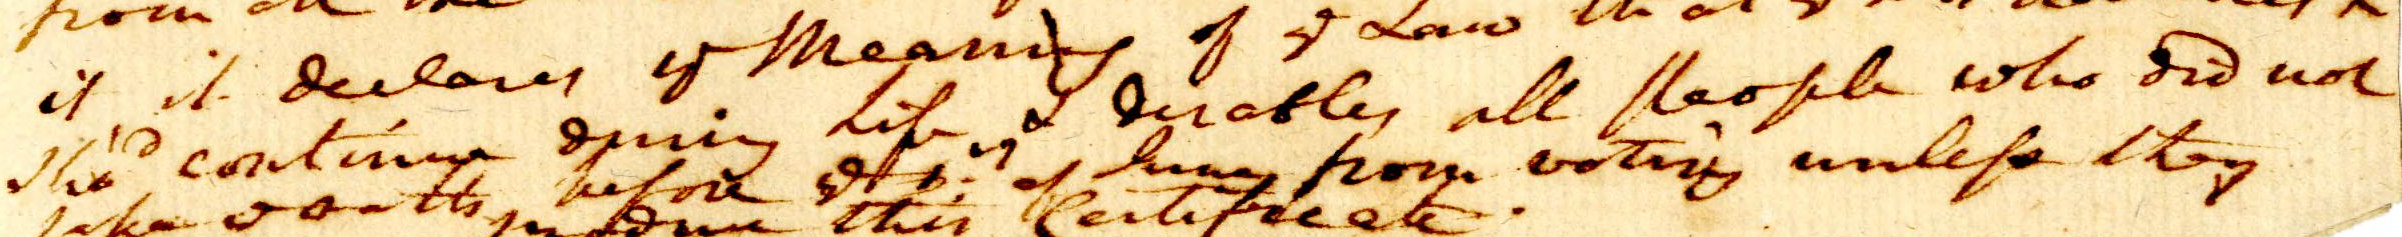sho^d continue during Life & disables all people who did not
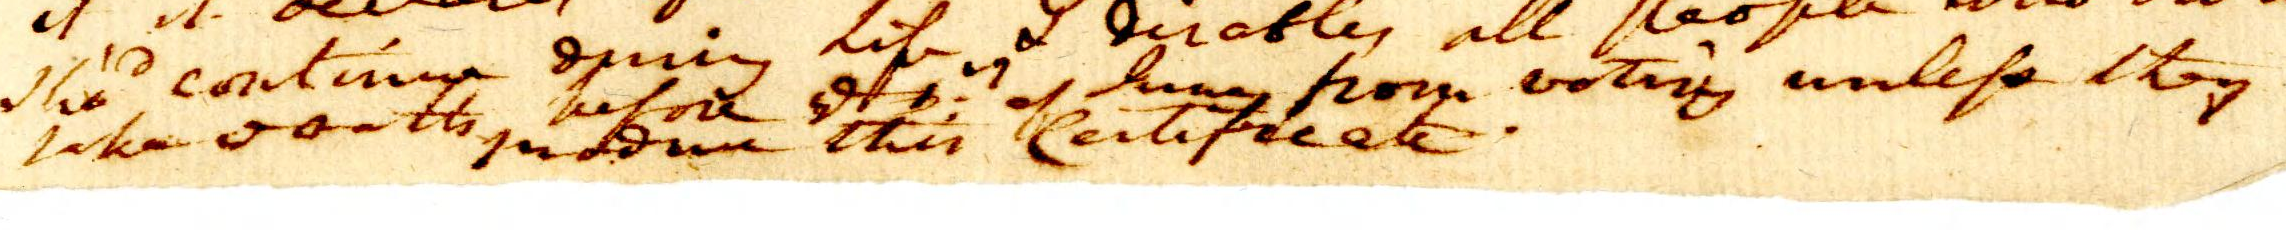take oaths before y^e 1^st of June from voting unless they
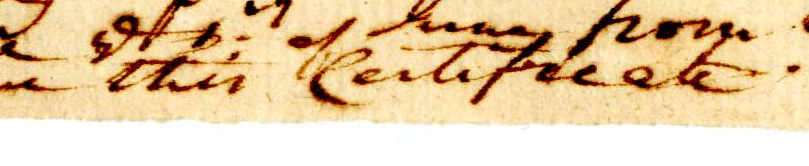produce this Certificate
